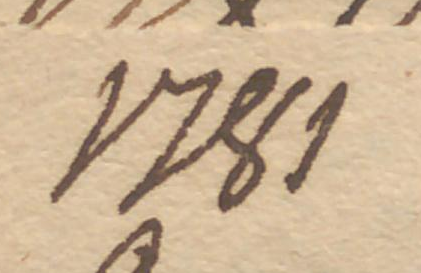1781
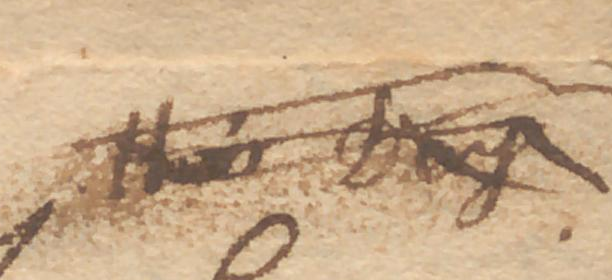[this day]
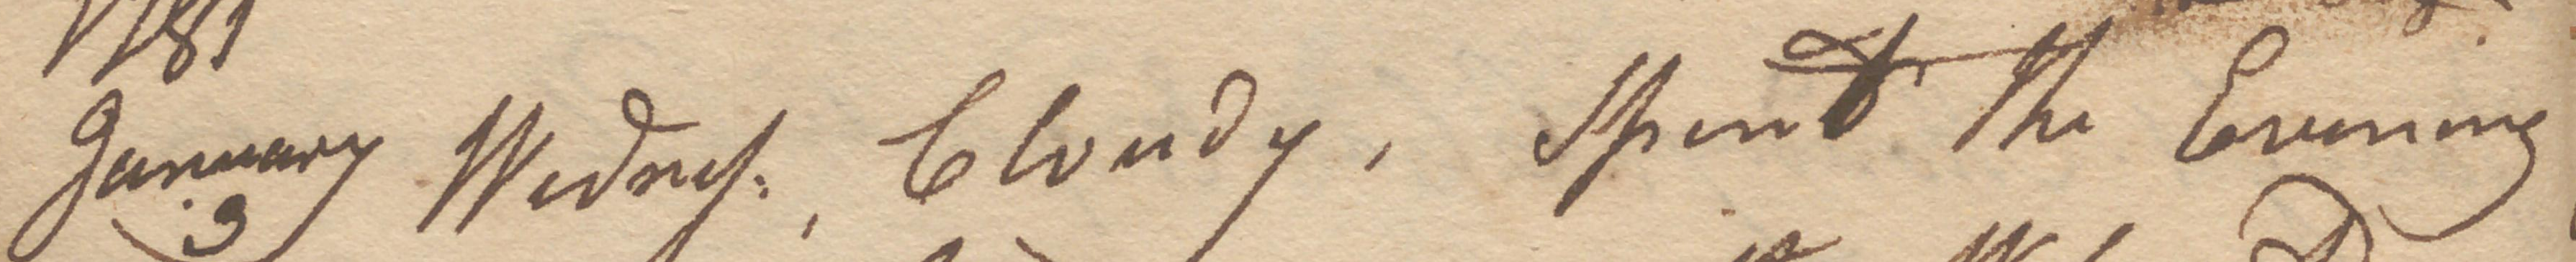January Wednes. Cloudy, Spend the Evening
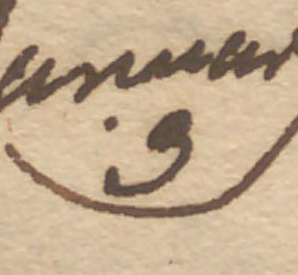3
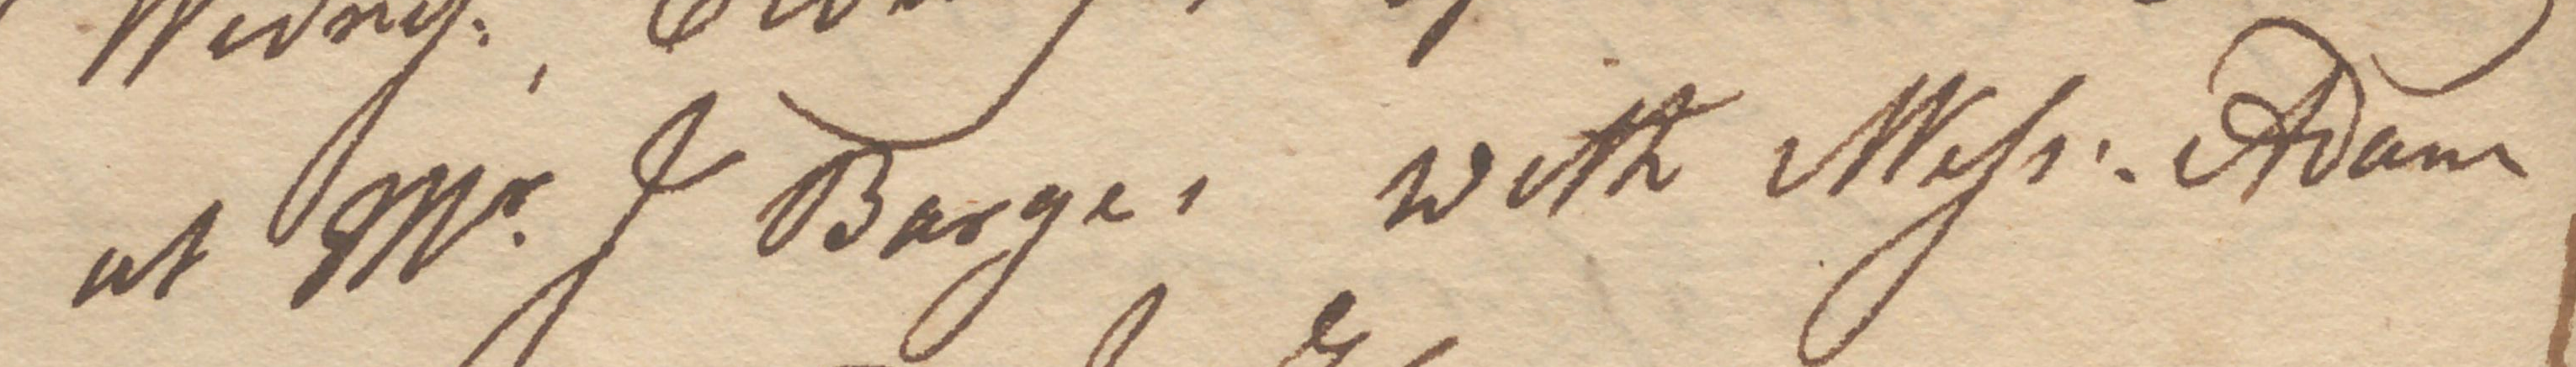at M^r. J Barges with Mess. Adam
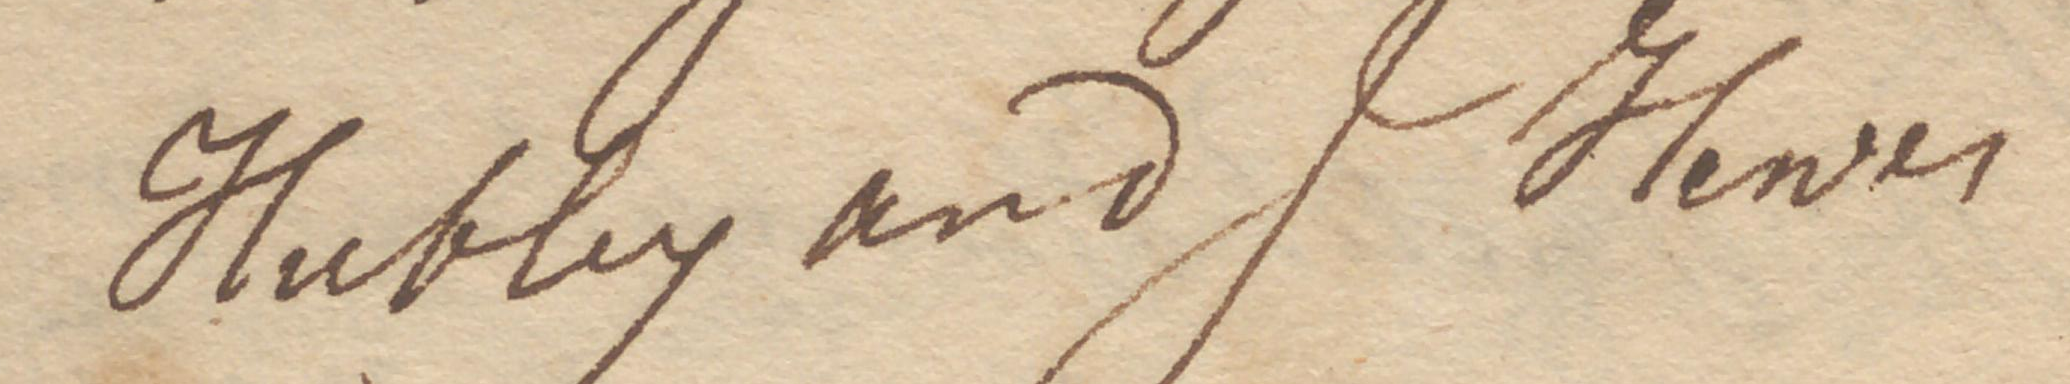Hubley and J Hewes
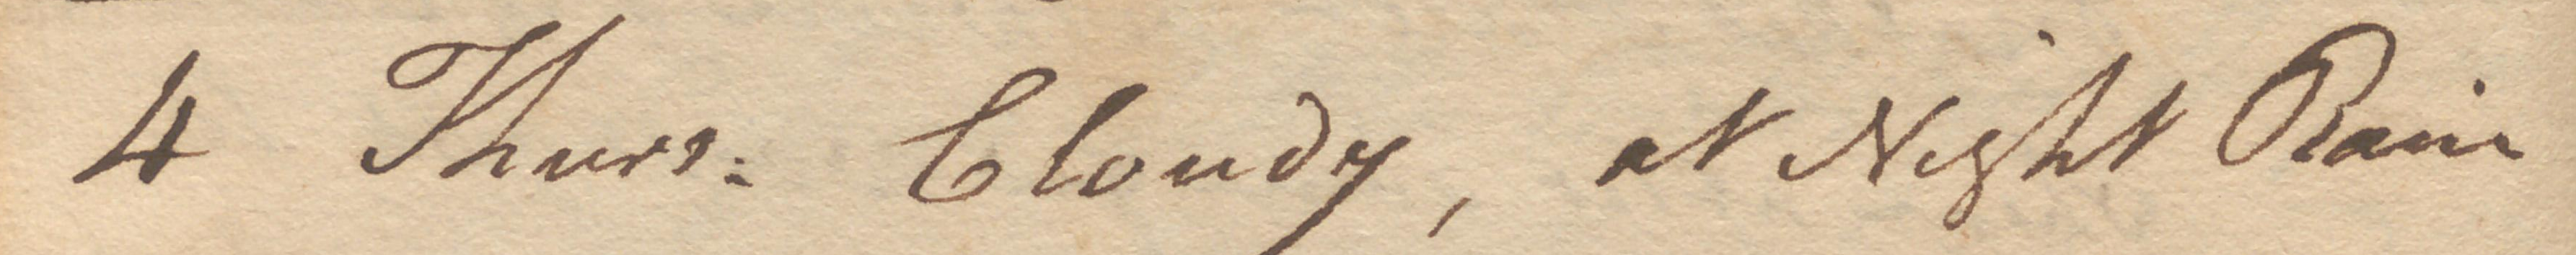4 Thurs. Cloudy at Night Rain
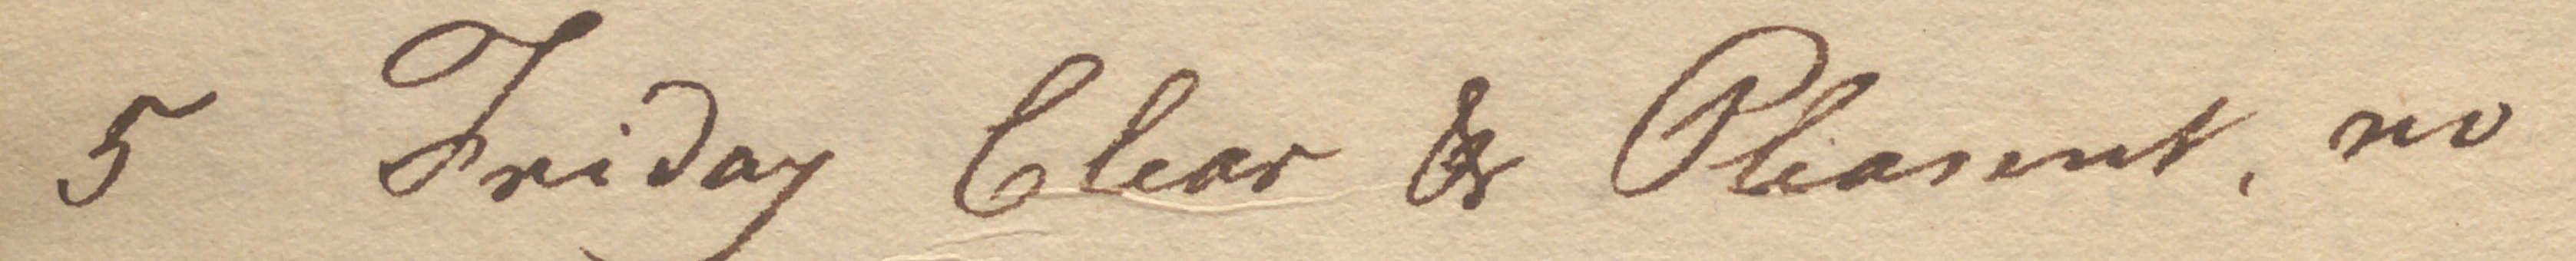5 Friday Clear & Pleasent, no
